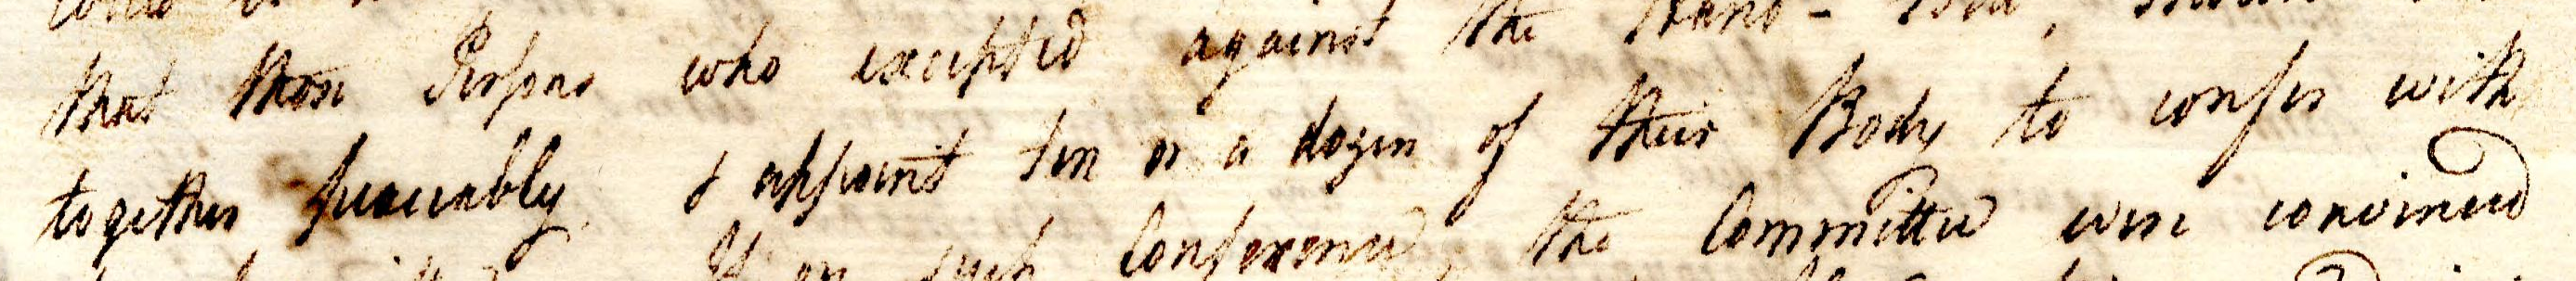together peacably & appoint ten or a dozen of their Body to confer with
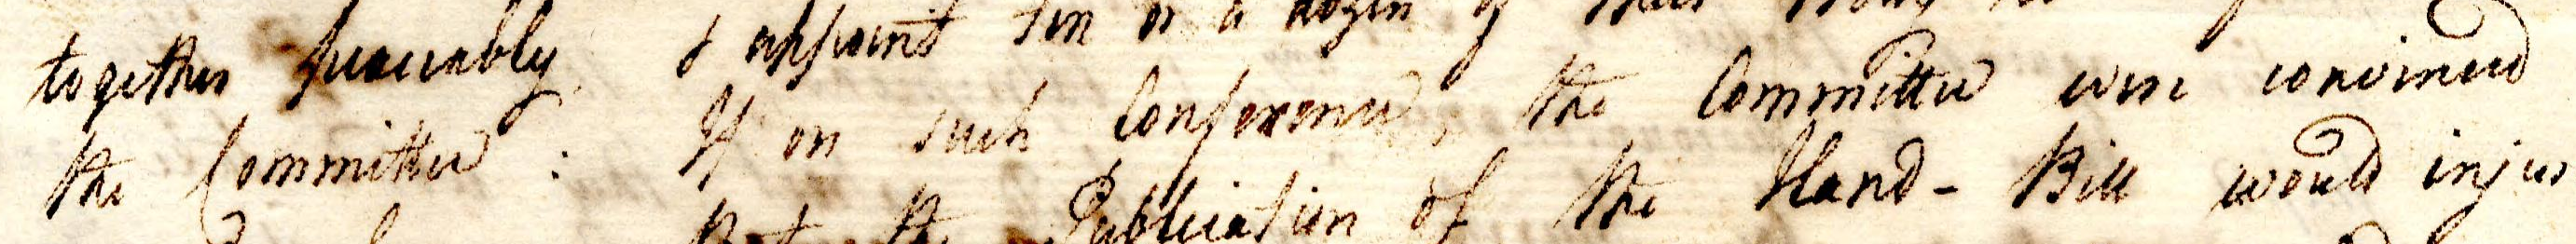the Committee: If on such Conference the Committee were convinced
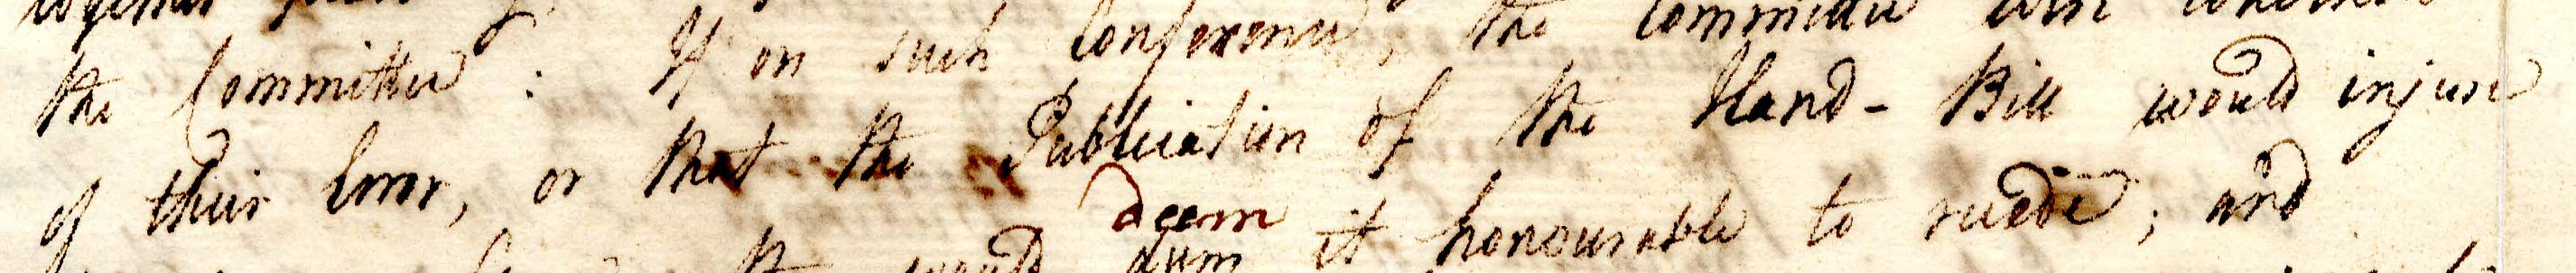of their Error, or that the Publication of the Hand- Bill would injure
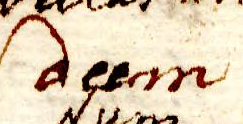deem
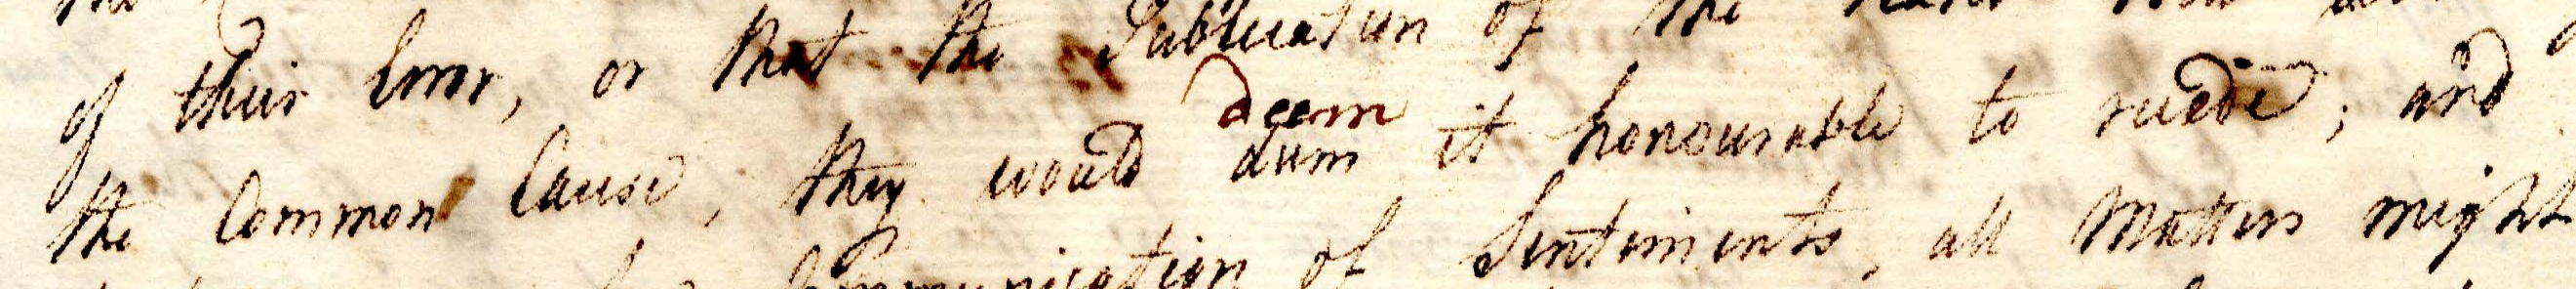the Common Cause, they would deem it honourable to ruede; and
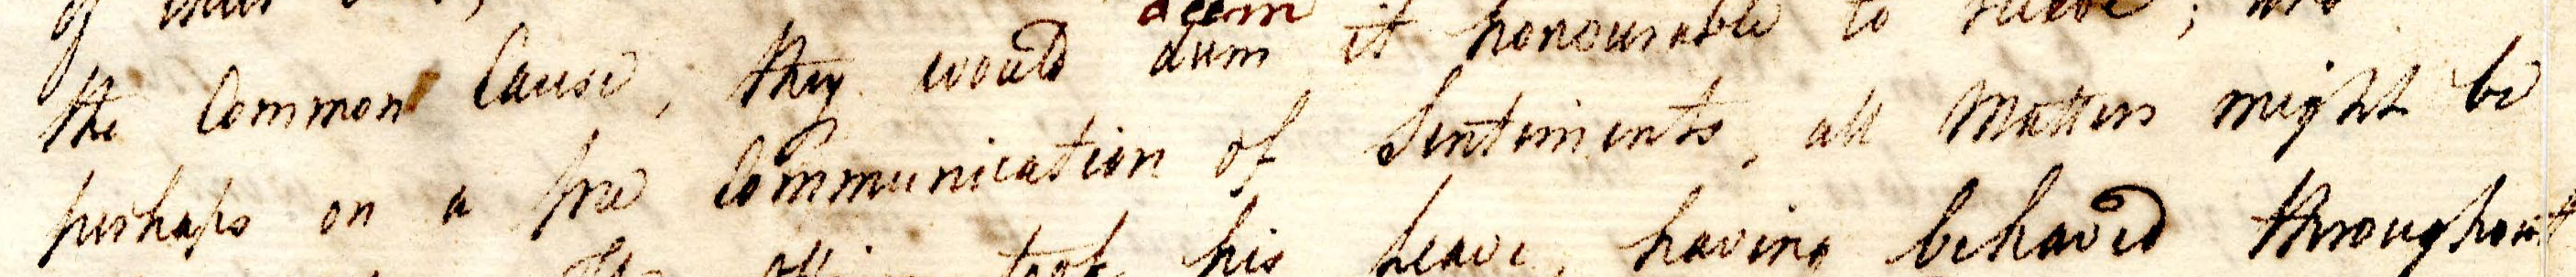perhaps on a free communication of Sentiments, all Matters might be
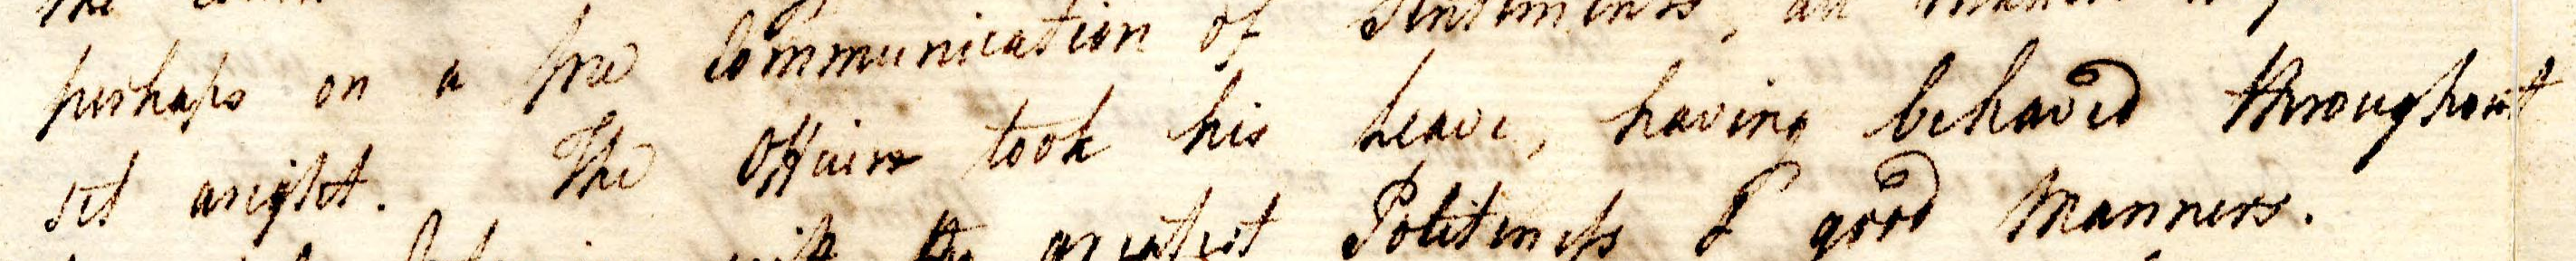set aright. The Officer took his leave, having behaved throughout
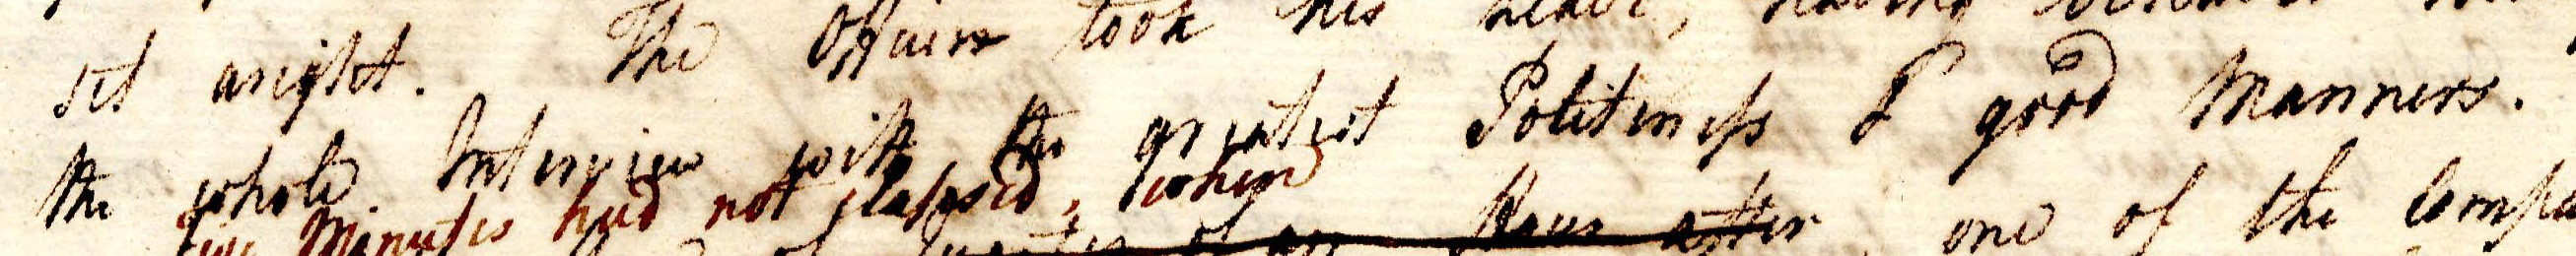the whole Interview with the greatest Politeness & good Manners.
